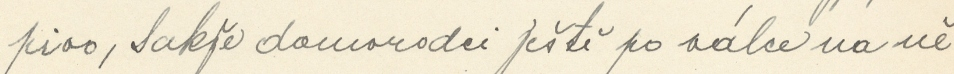pivo, takže domorodci ještě po válce na ně
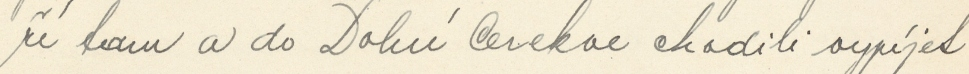ří tam a do Dolní Cerekve chodili vypíjet
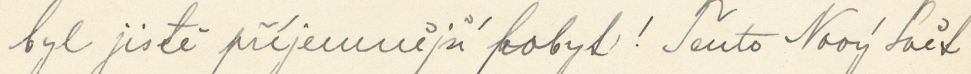byl jistě příjemnější pobyt! Tento Nový Svět
